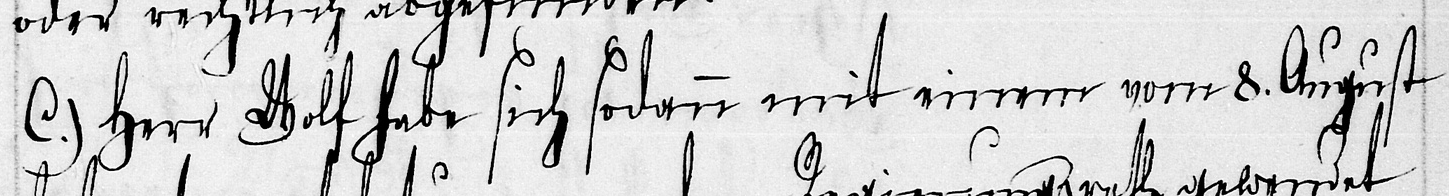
C.) Herr Wolf habe sich sodann mit einem vom 8. August
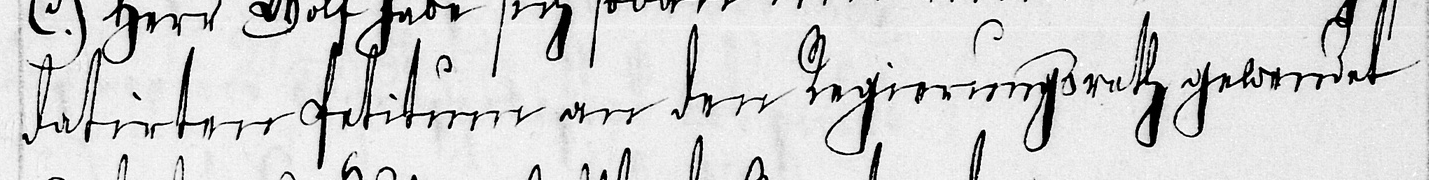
datirten Petitum an den Regierungsrath gewendet
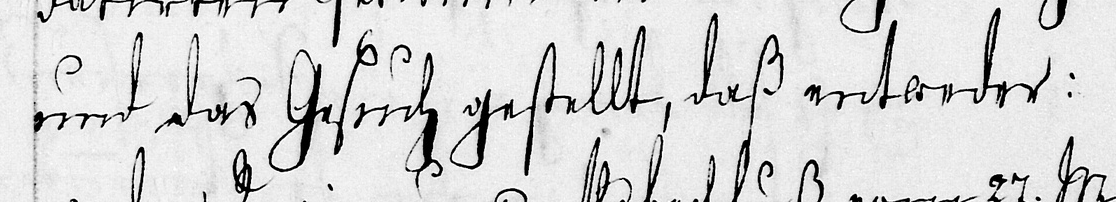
und das Gesuch gestellt, daß entweder:
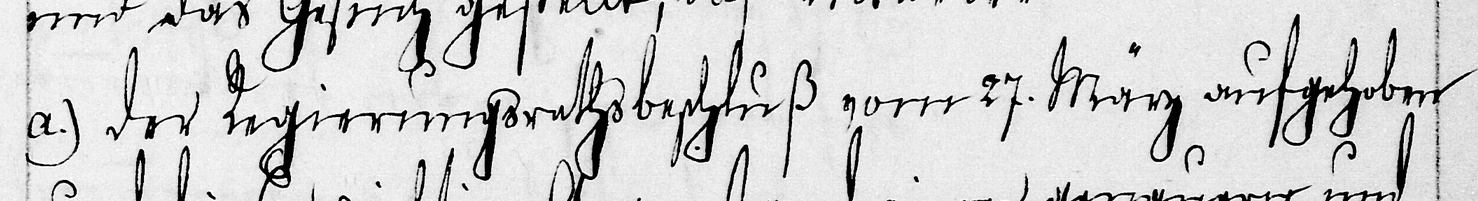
a.) der Regierungsrathsbeschluß vom 27. März aufgehoben
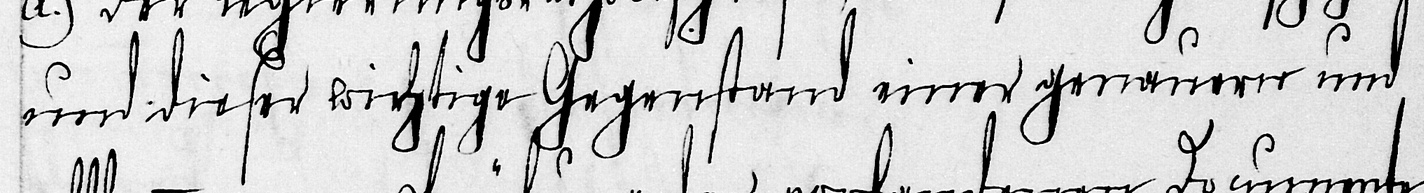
und dieser wichtige Gegenstand einer genauern und
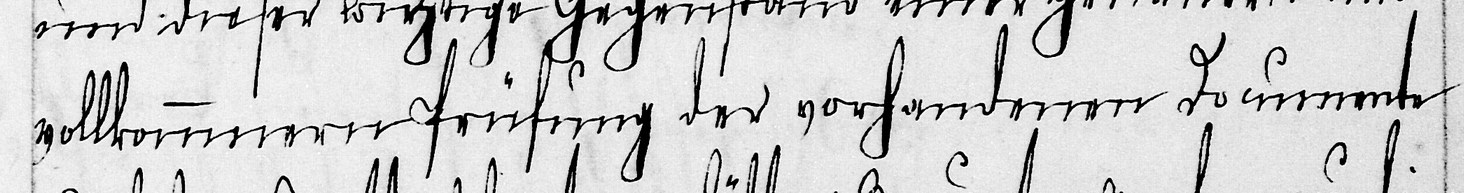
vollkommenern Prüfung der vorhandenen Documente
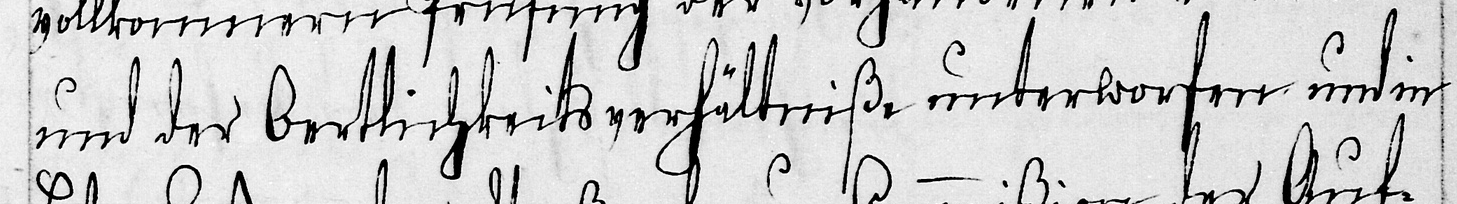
und der Oertlichkeitsverhältniße unterworfen und in
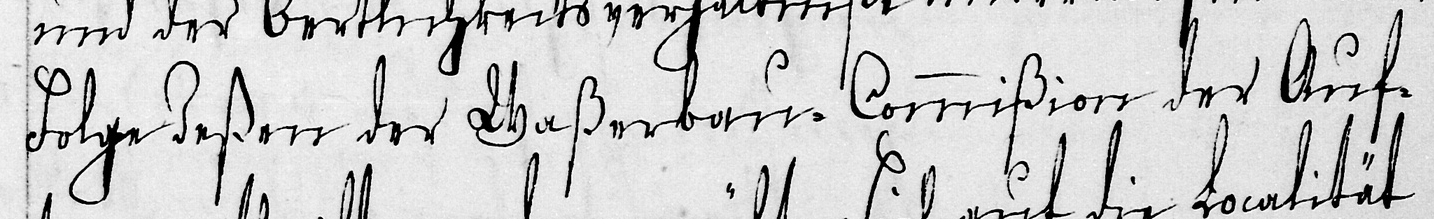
Folge deßen der Waßerbau-Commißion der Auf¬
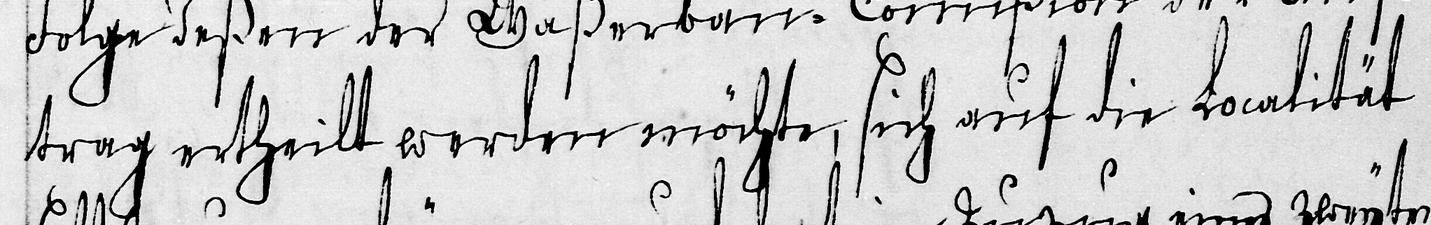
trag ertheilt werden möchte, sich auf die Localität
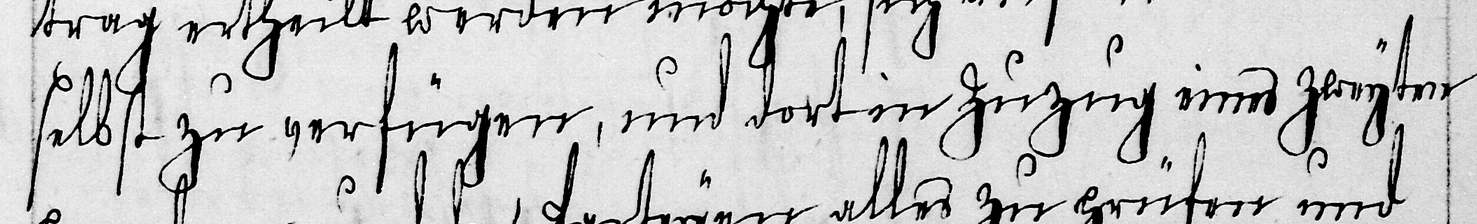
selbst zu verfügen, und dort in Zuzug eines zweyten
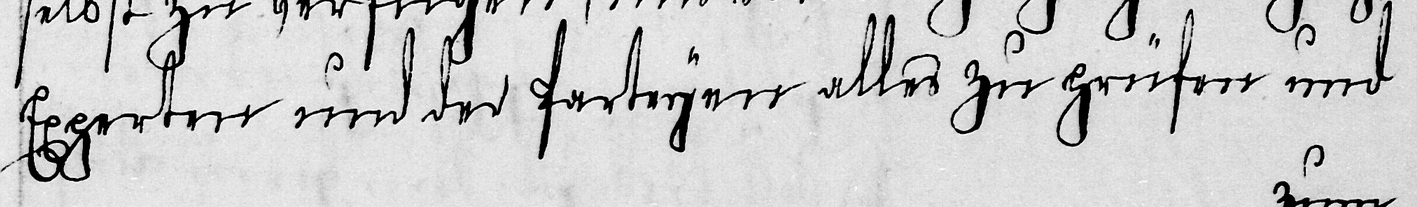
Experten und der Parteyen alles zu prüfen und
